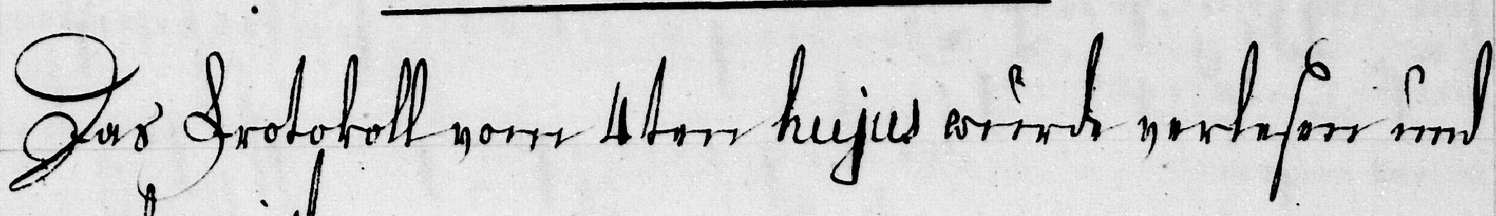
Das Protokoll vom 4ten hujus wurde verlesen und
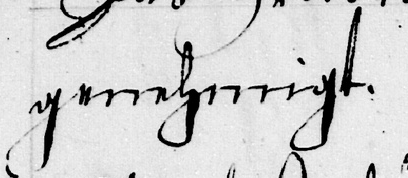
genehmigt.
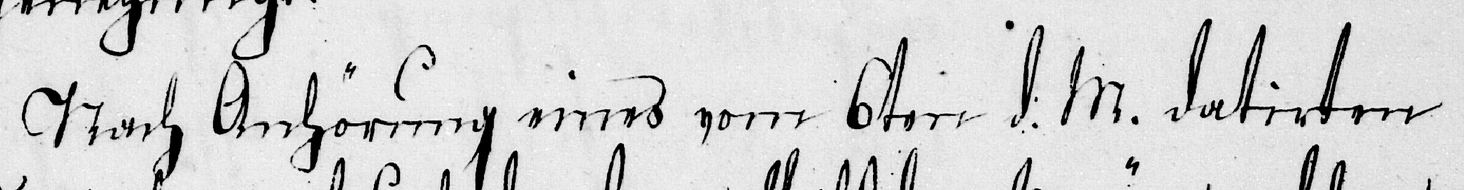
Nach Anhörung eines vom 6ten d. M. datirten
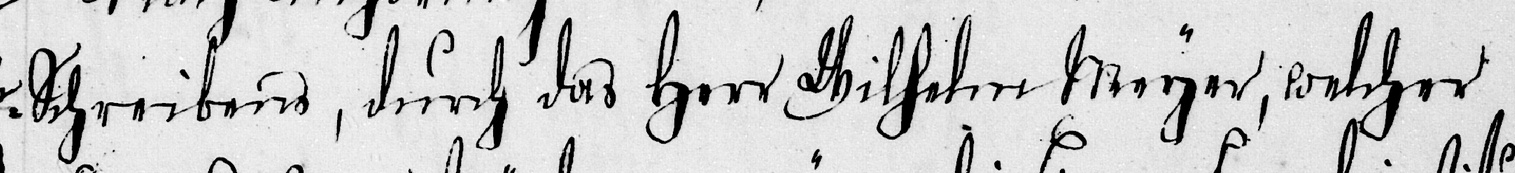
Schreibens, durch das Herr Wilhelm Meyer, welcher
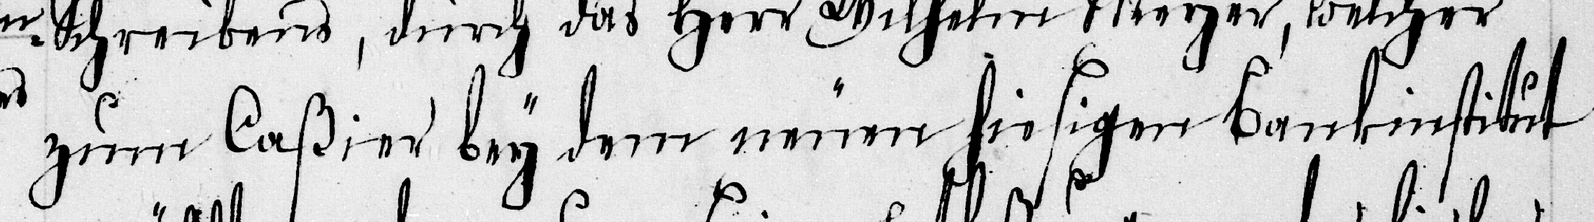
zum Caßier bey dem neuen hiesigen Bankeninstitut
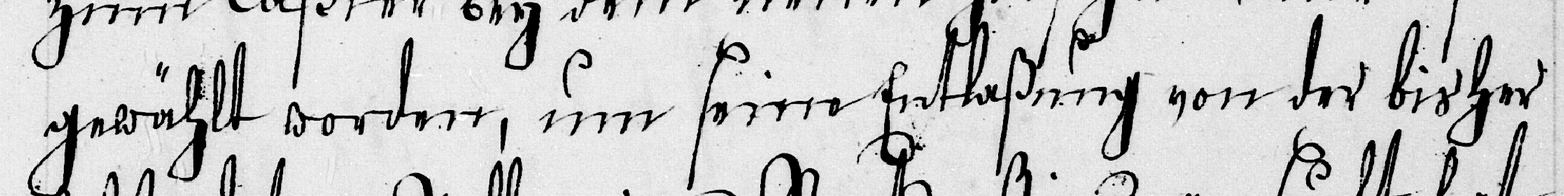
gewählt worden, um seine Entlaßung von der bisher
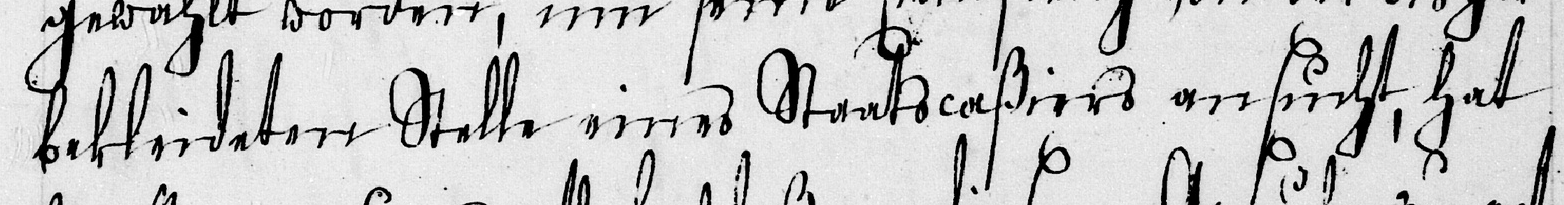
bekleideten Stelle eine Staatscaßiers ansucht, hat
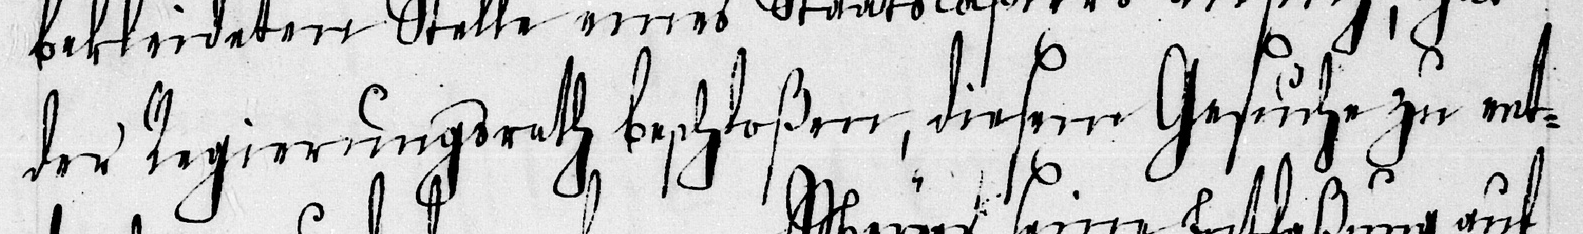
der Regierungsrath beschloßen, diesem Gesuch zu ent¬
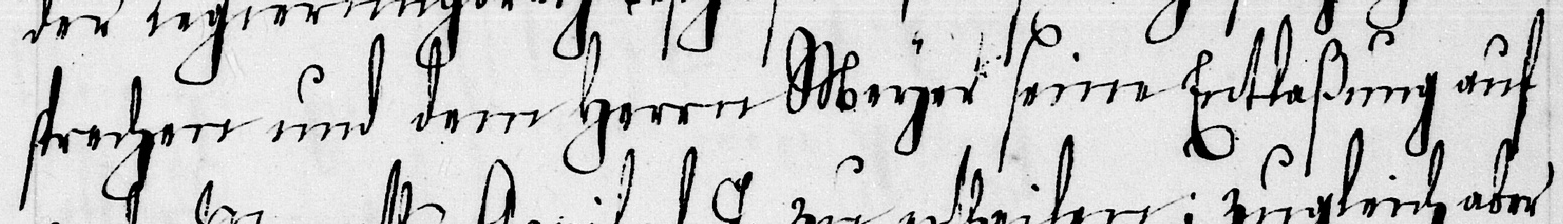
sprechen und dem Herrn Meyer seine Entlaßung auf
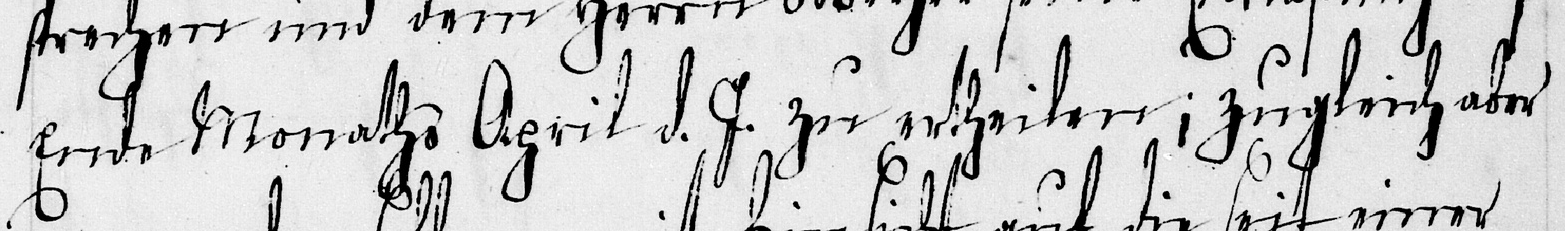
Ende Monath April d. J. zu ertheilen; zugleich aber
